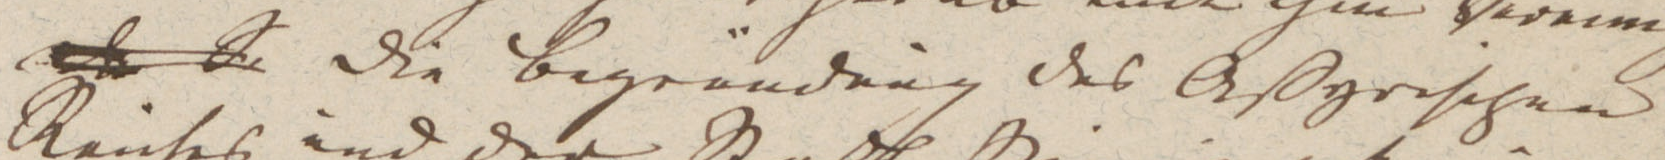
D S Die Begründung des Assyrischen
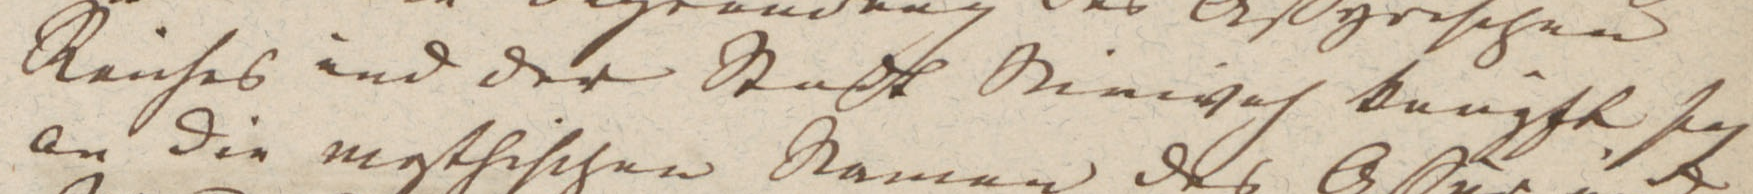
Reiches und der Stadt Niniveh knüpft sich
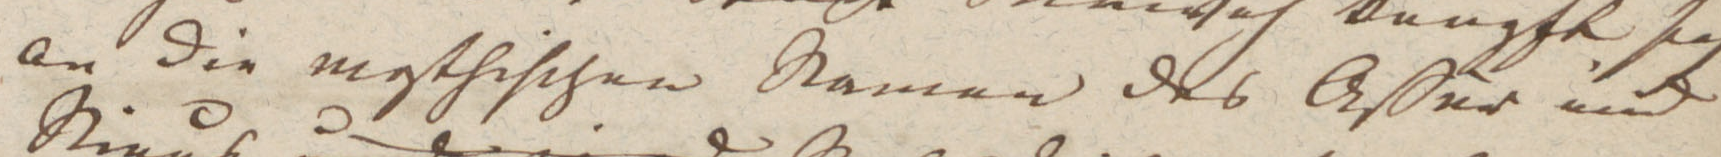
an die mythischen Namen des Assur und
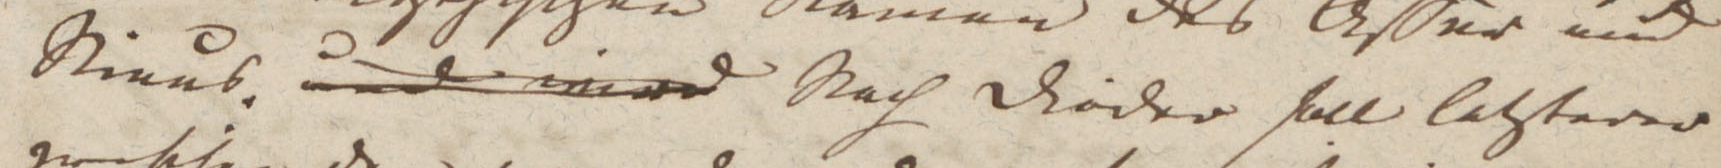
Ninus. und wird Nach Diodor soll letzterer
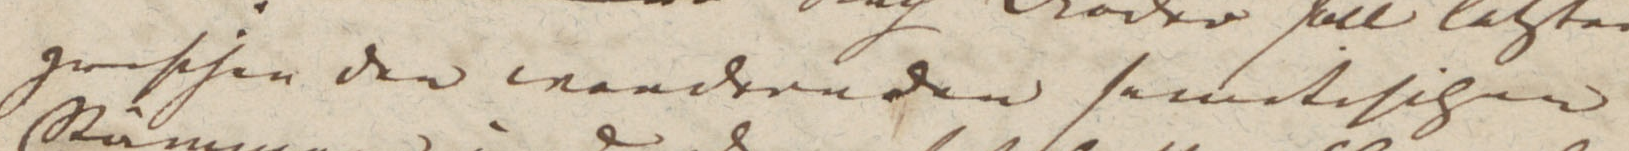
zwischen den wandernden semitischen
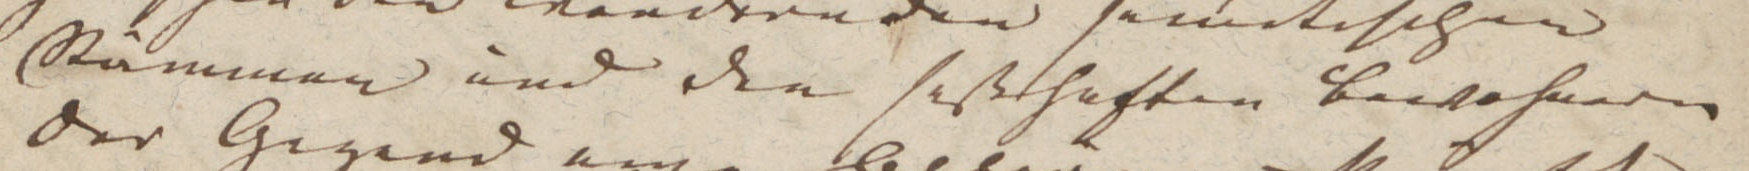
Stämmen und den sesshaften Bewohnern
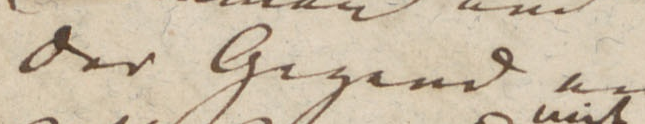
der Gegend eine
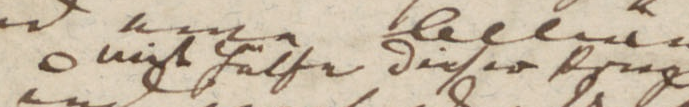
und, mit Hülfe dieser kriegerischen
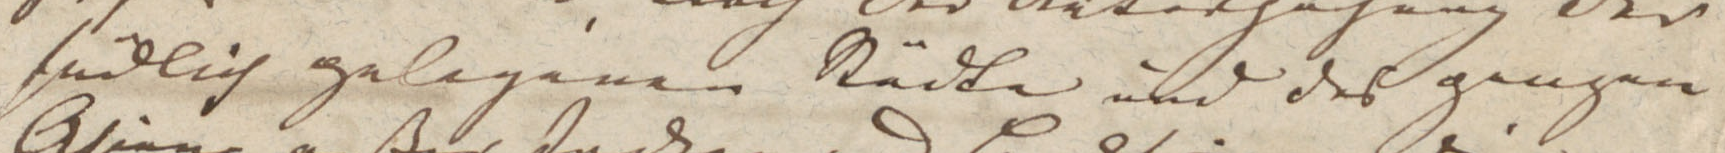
südlich gelegenen Städte und des ganzen
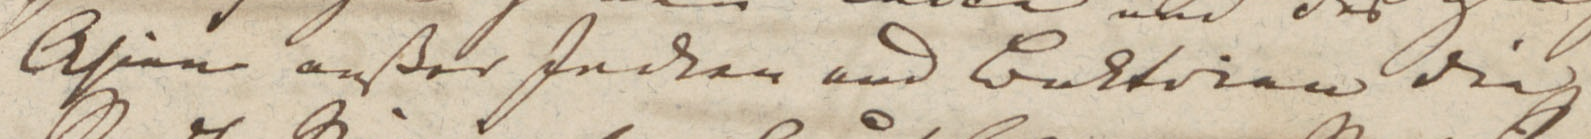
Asien ausser Indien und Baktrien die
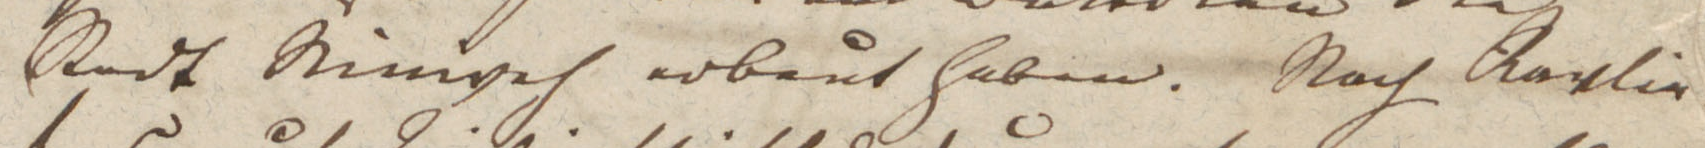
Stadt Niniveh erbaut haben. Nach Rawlin-
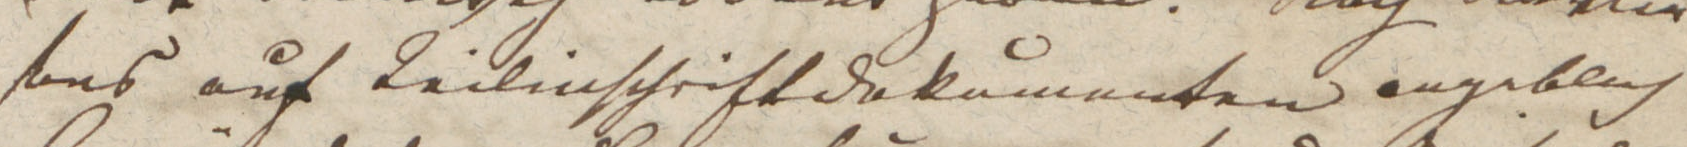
sons auf Keilinschriftdokumenten angeblich
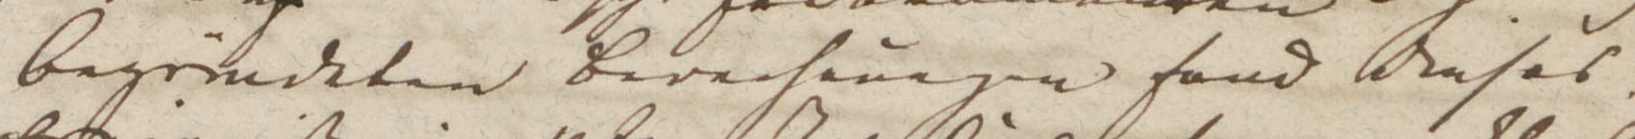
begründeten Berechnungen fand dieses
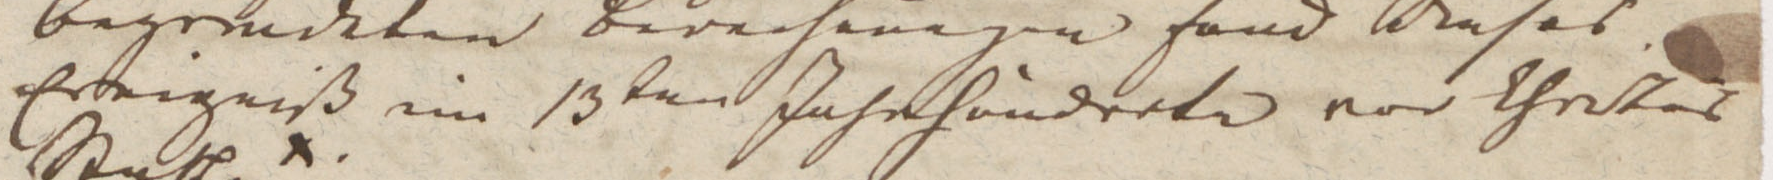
Ereigniss im 13ten Jahrhunderte vor Christus
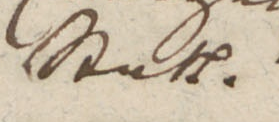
Statt. %
